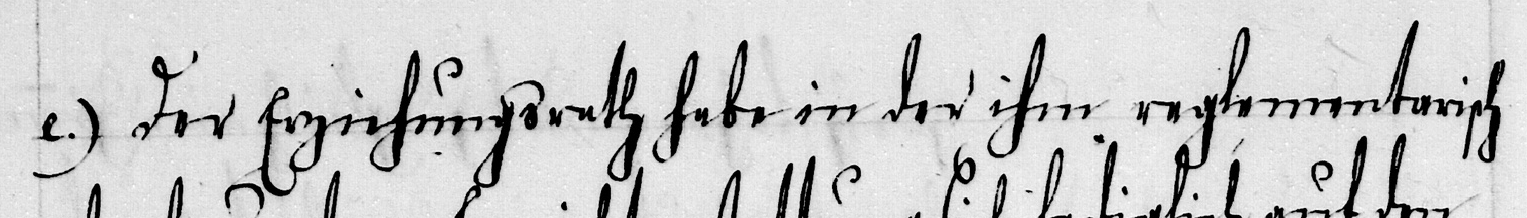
e.) Der Erziehungsrath habe in der ihm reglementarisch
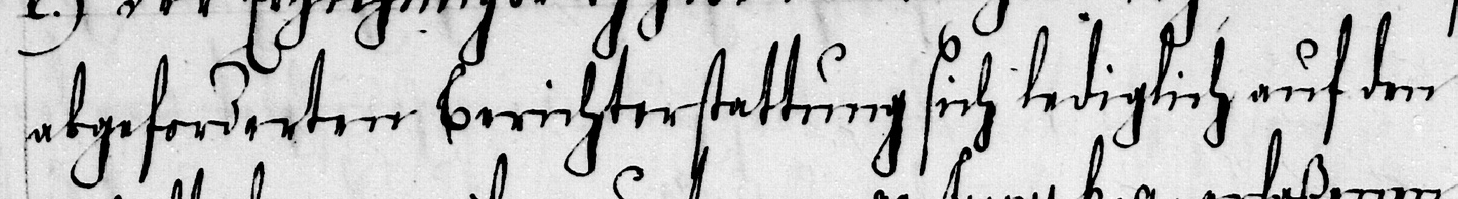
abgeforderten Berichterstattung sich lediglich auf den
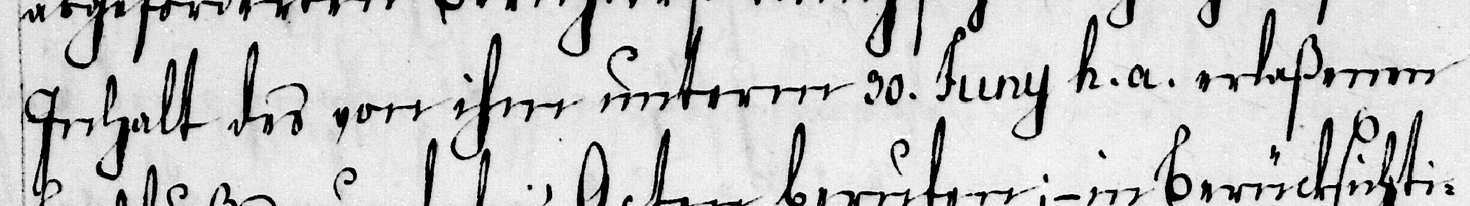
Inhalt des von ihm unterm 30. Juny h. a. erlaßenen
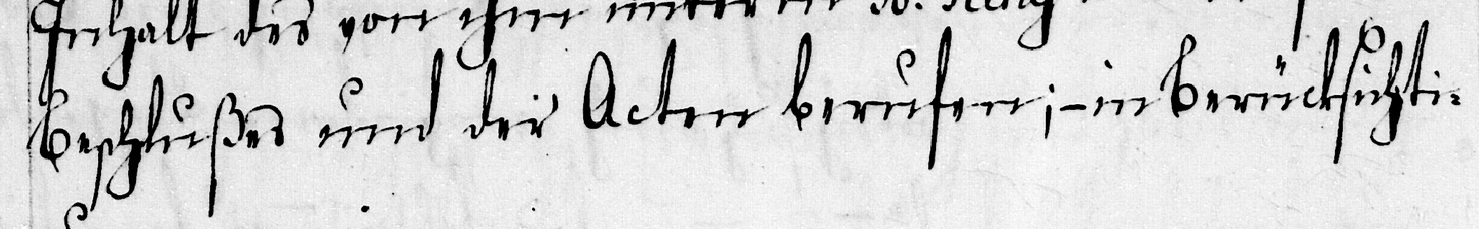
Beschlußes und der Acten berufen: – in Berücksichti¬
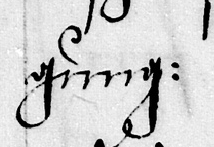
gung:
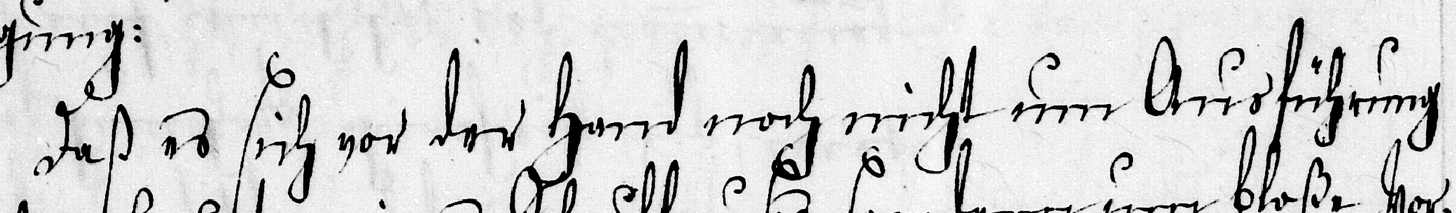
Daß es sich vor der Hand noch nicht um Ausführung
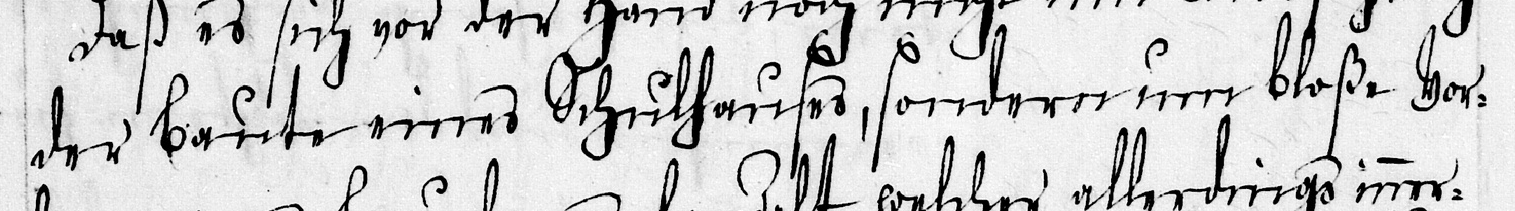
der Baute eines Schulhauses, sondern um bloße Vor¬
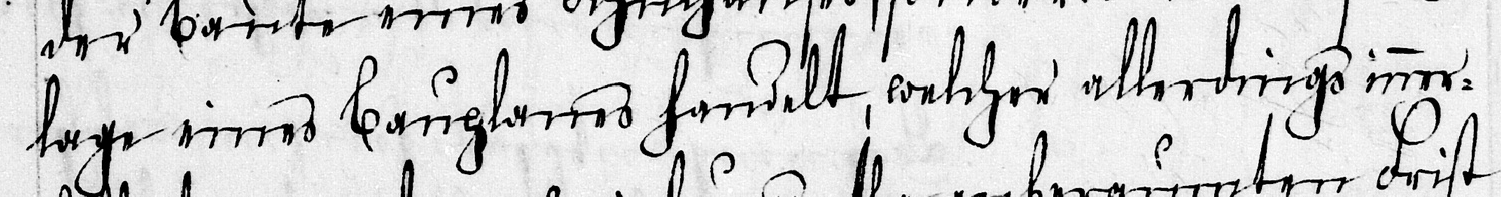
lage eines Bauplanes handelt, welcher allerdings inne¬
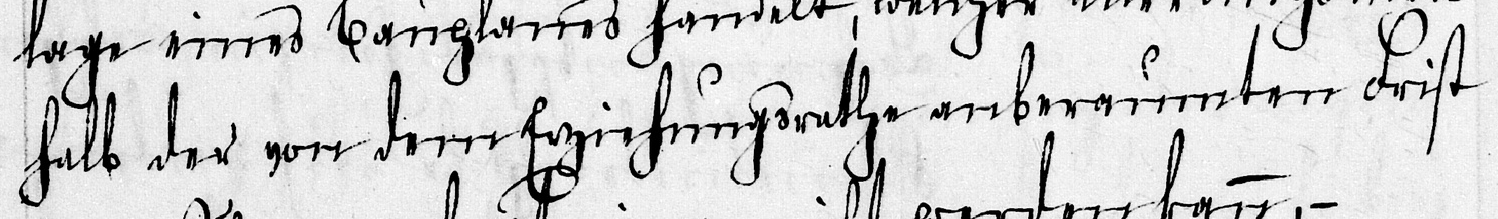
rhalb der von dem Erziehungsrathe anberaumten Frist
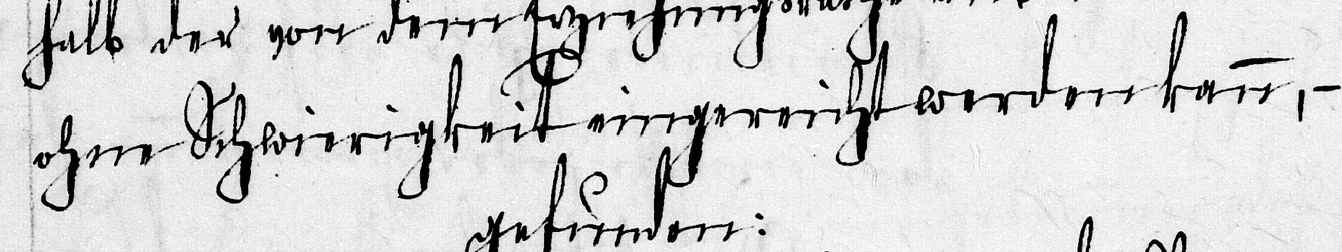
ohne Schwierigkeit eingereicht werden kann, –
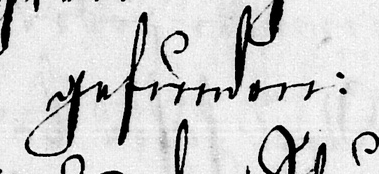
gefunden:
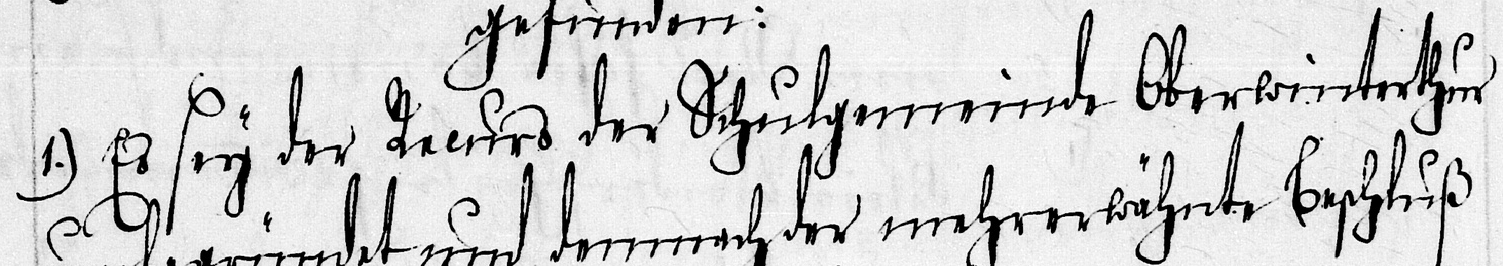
1.) Es sey der Recurs der Schulgemeinde Oberwinterthur
